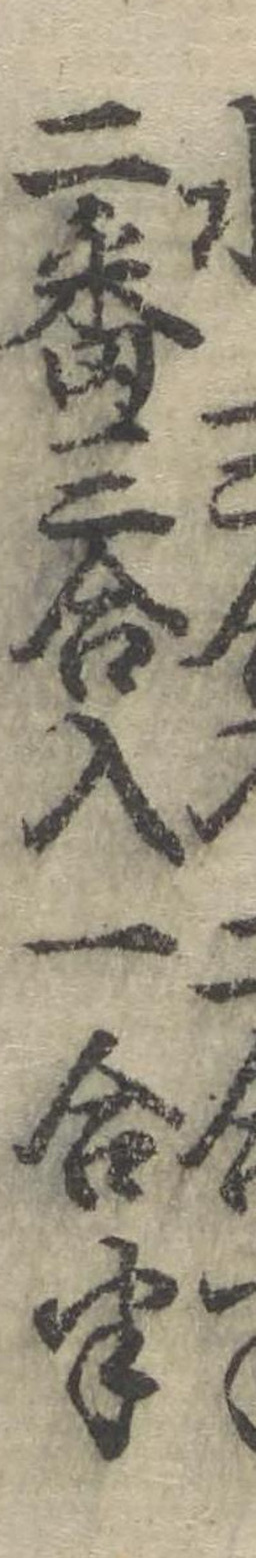二番三合入一合半
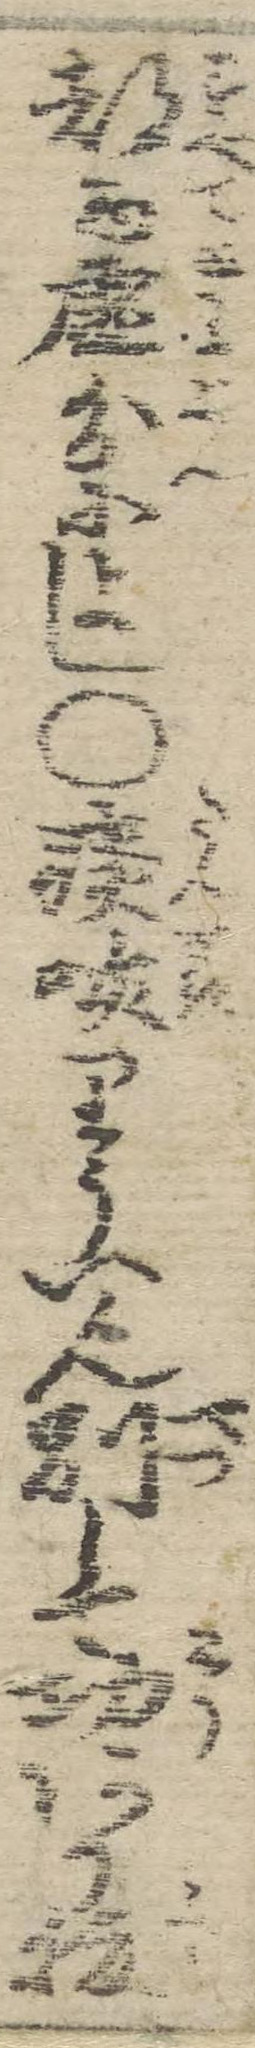都而虚分によし〇痰咳りういん別して功あり腹
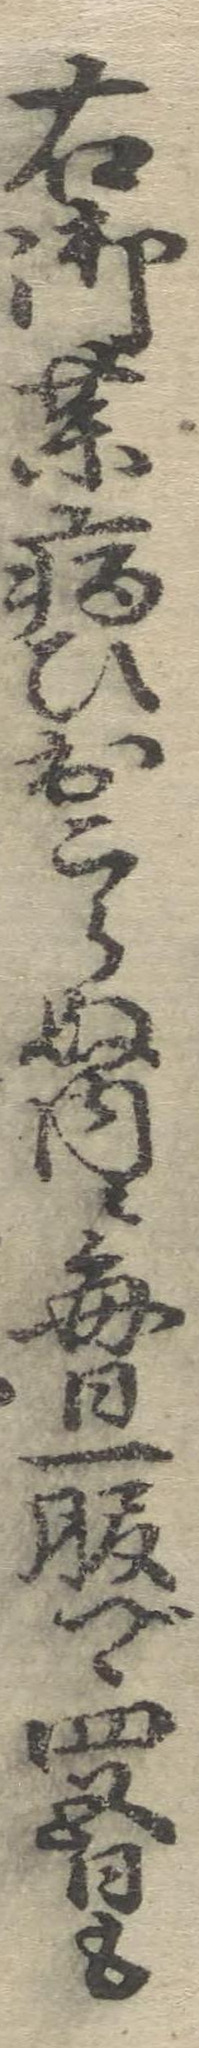右御薬病ひおこらぬ内に毎日一服づゝ四五日も
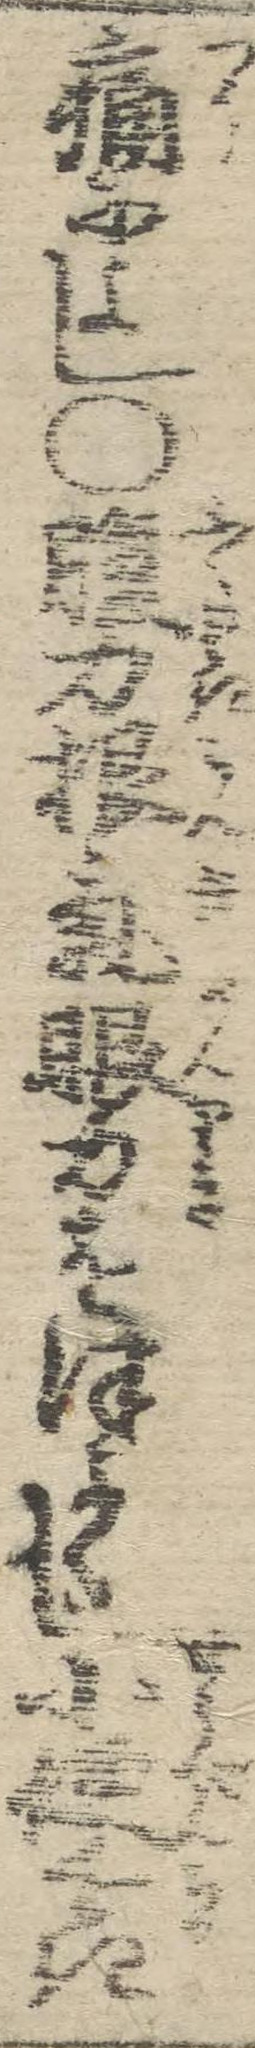痛によし○腹力根気眼力をつよくにし小便近き
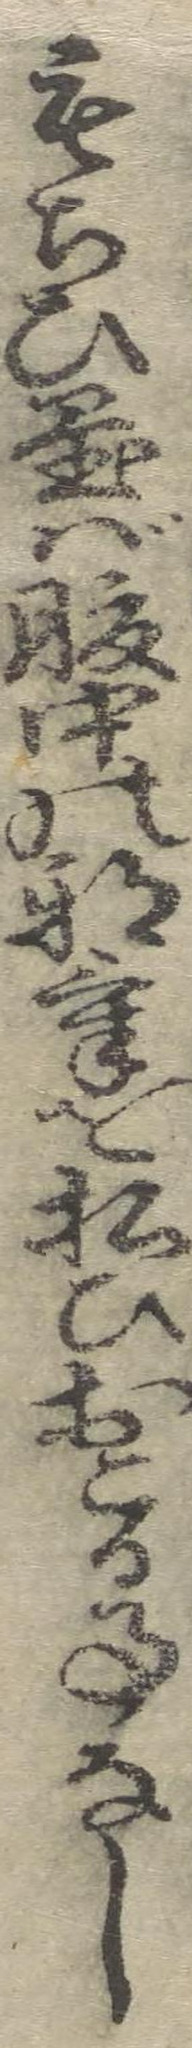もちひ置ば腹中の邪気を払ひおこる事なし
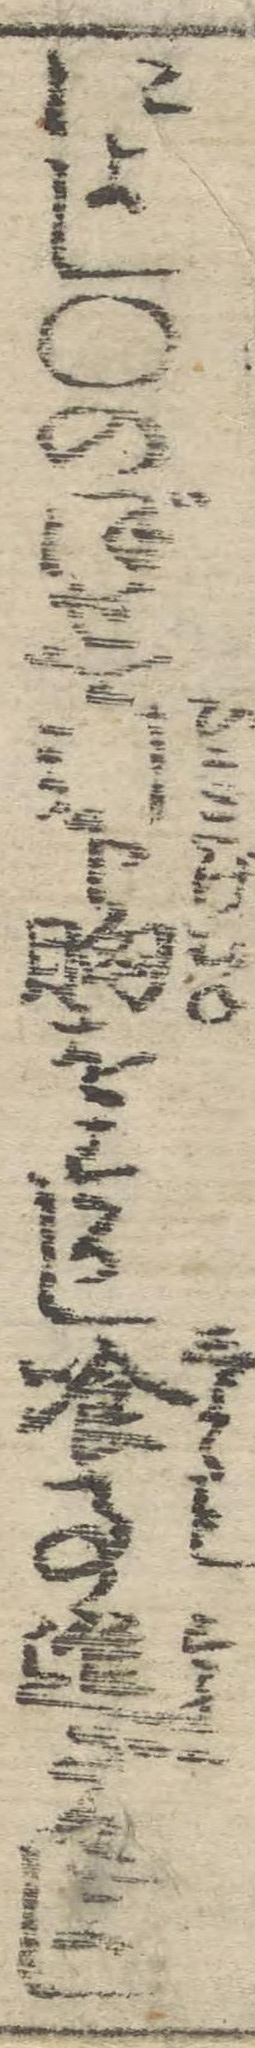によし〇のぼせを引下胸をすかし喰事進ざるによし
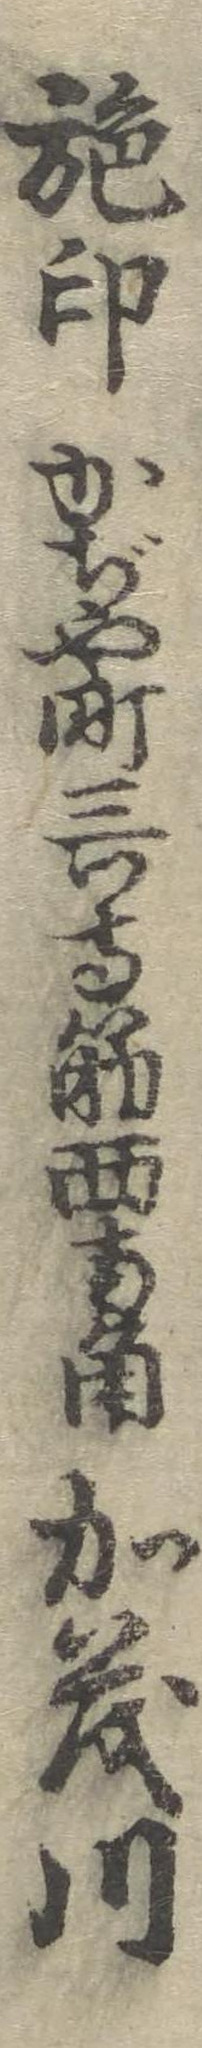施印かじや町三ッ寺筋西南角加茂川
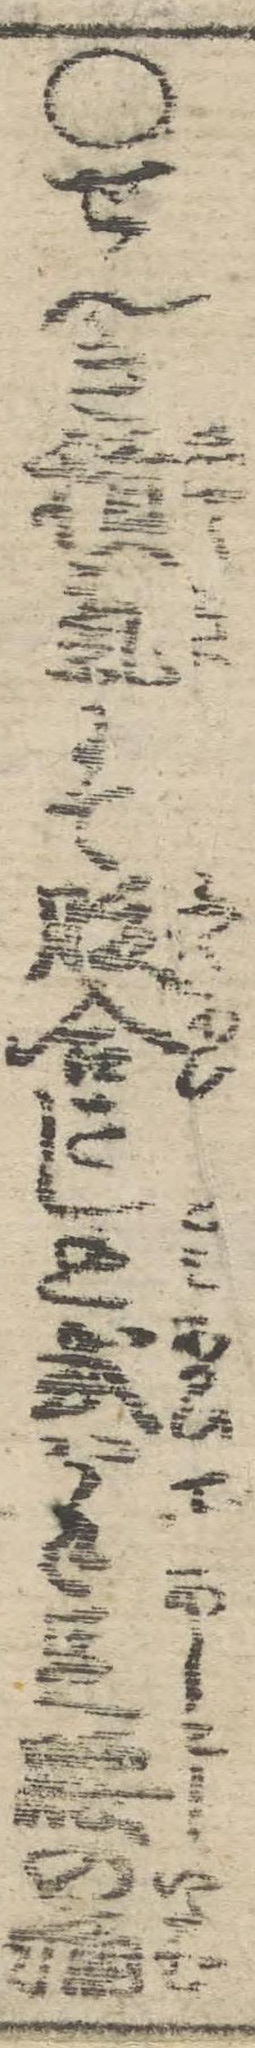〇せんき積気にて腹合さし込或は手足腰の痛
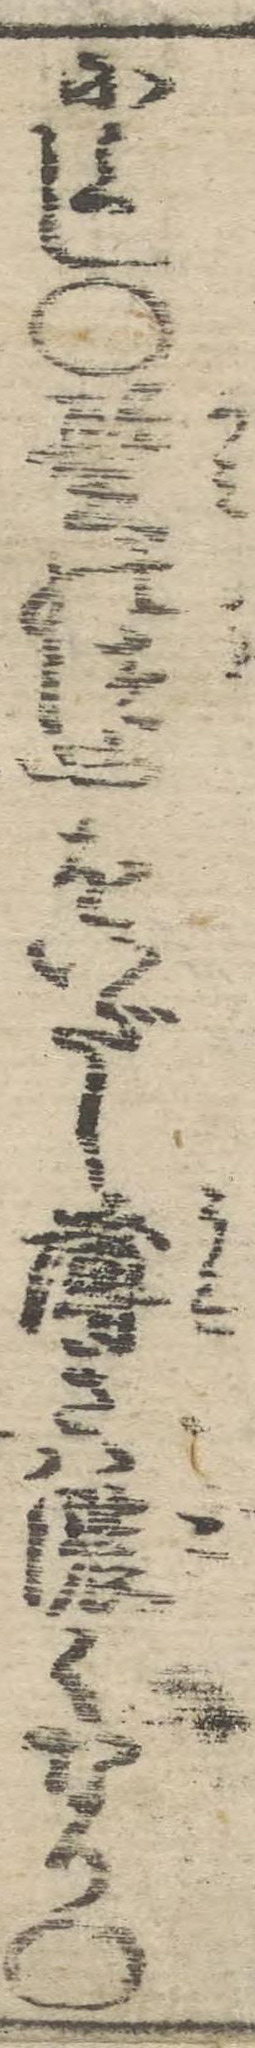によし〇髪のつやをいだし薄きは濃くなり〇
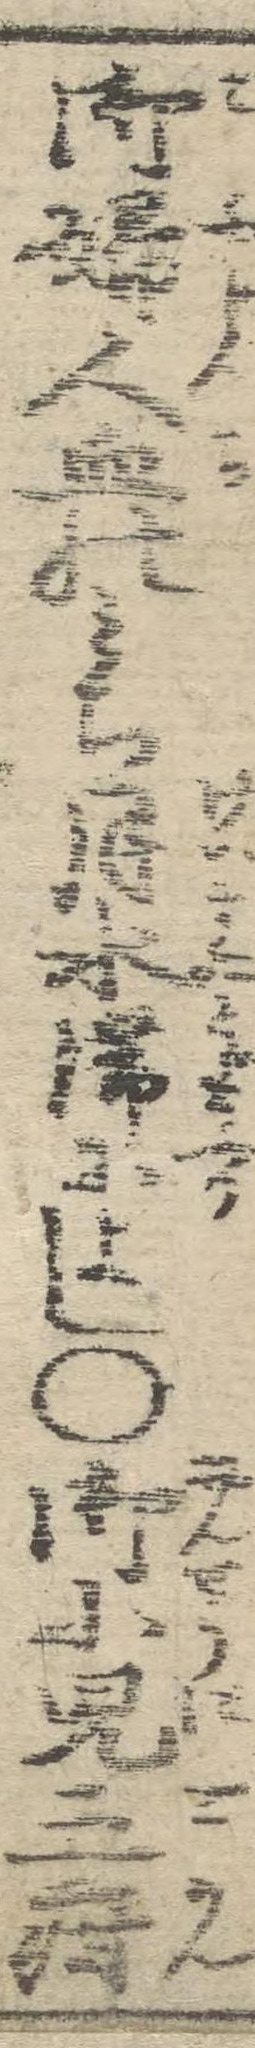御婦人血のみち月水滞によし〇御小児五疳
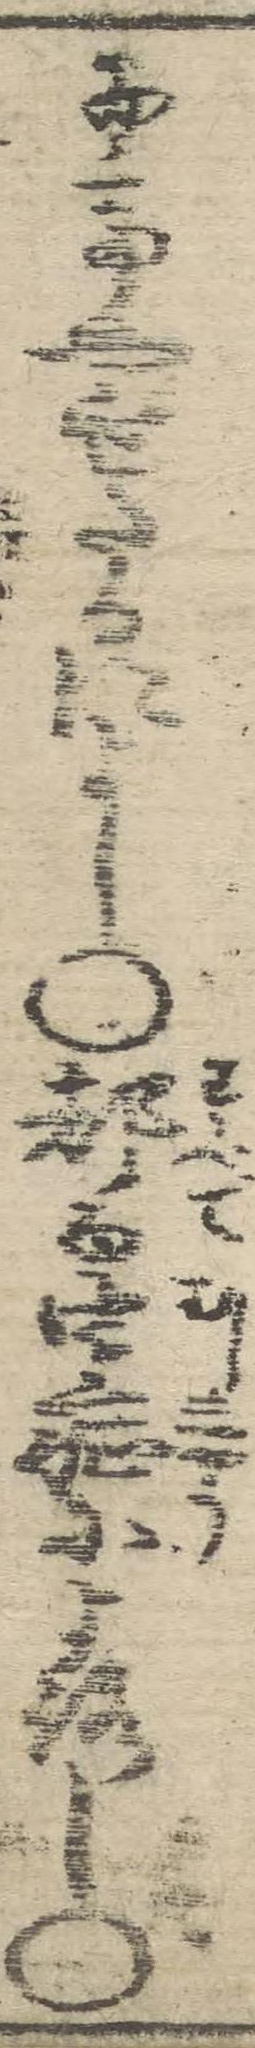にてやせたるによし〇都而虫症によろし〇
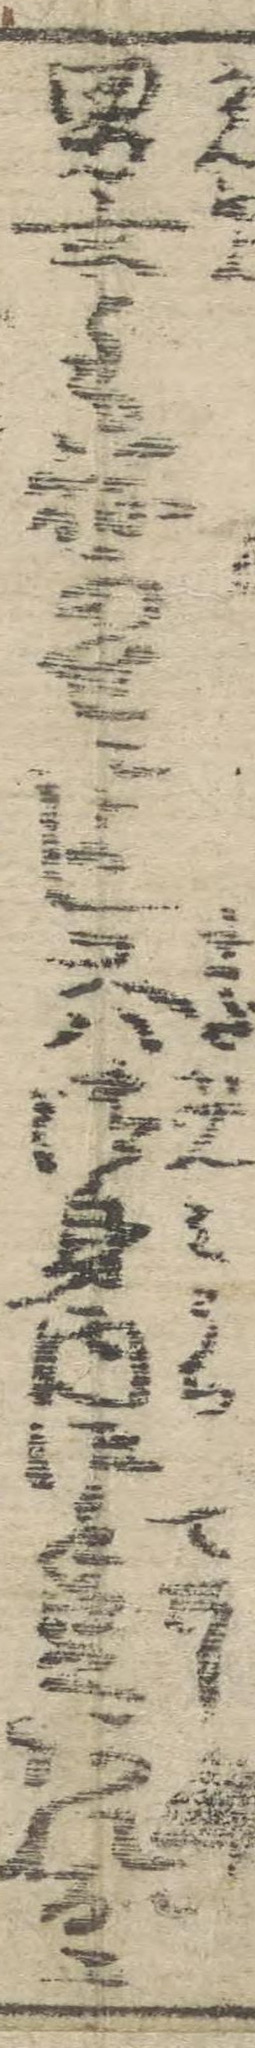男女ともねあせによし又は御身内御手足あれるに
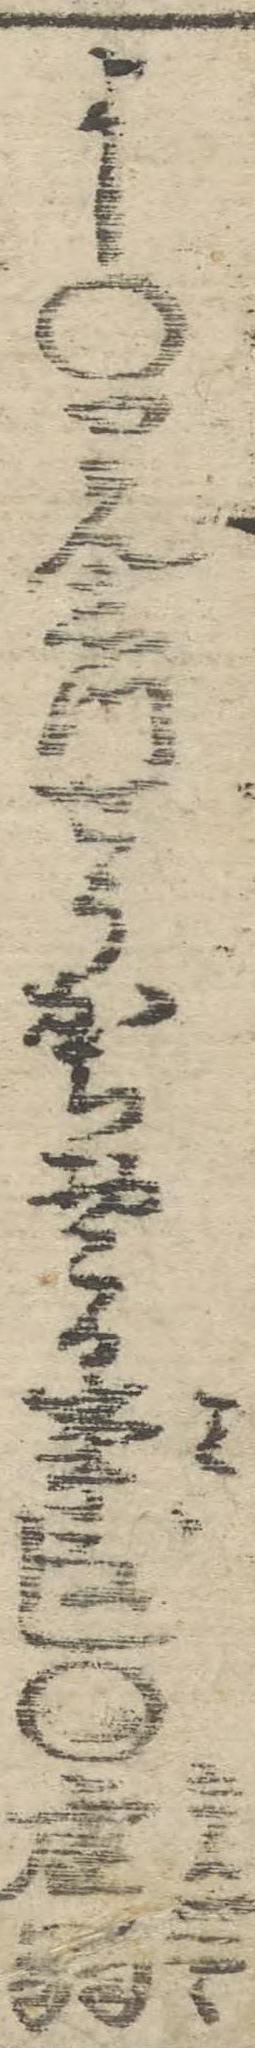よし〇りんしつせうかちおこる事なし〇虚弱
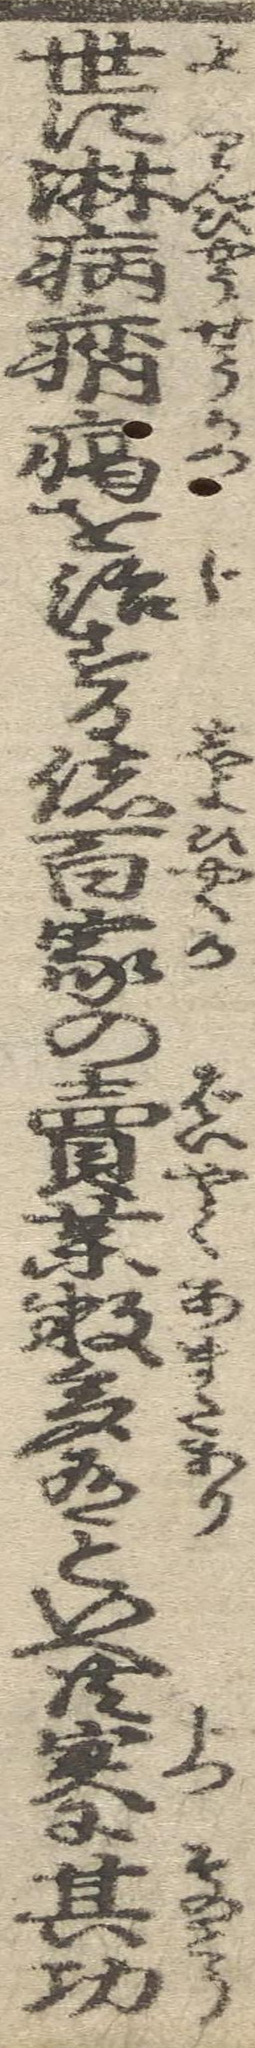世に淋病痟𤸎を治する諸百家の売薬数多有といへ共実に其功
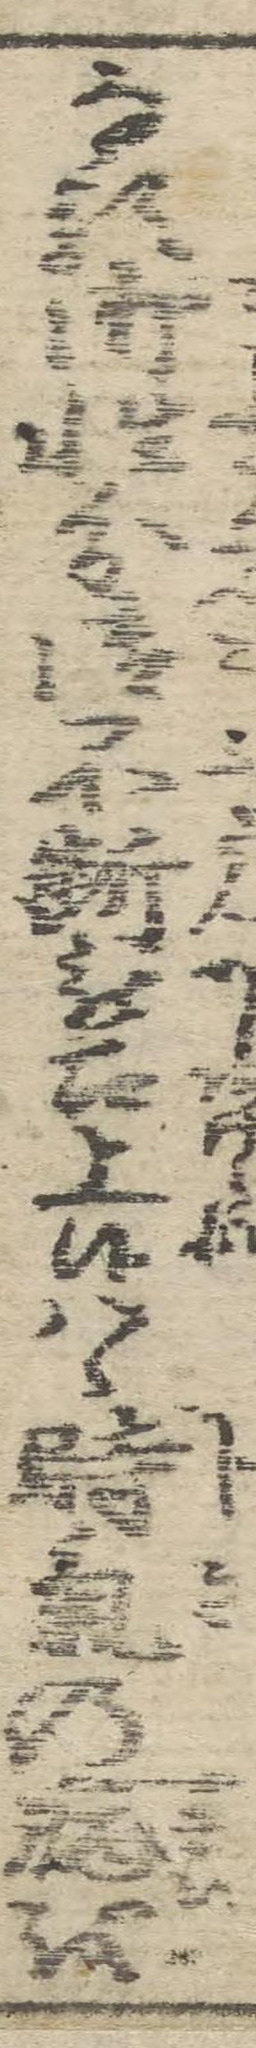なる御性分御不断被召上候はゝ時気の病を
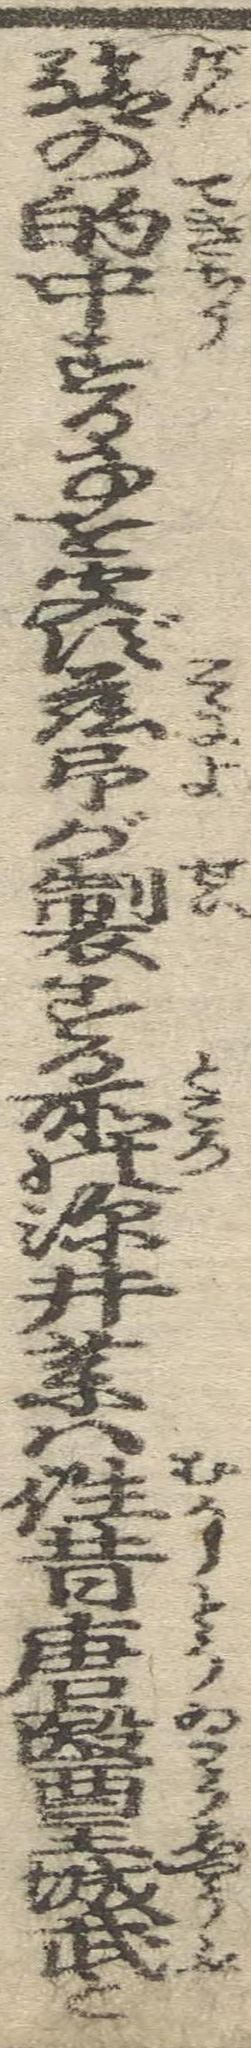験の的中する事を聞ず茲予が製する所の深井薬は往昔唐医王城武と
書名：浪華薬種問屋能書張交帖. 二
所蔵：国立国会図書館 National Diet Library, JAPAN
